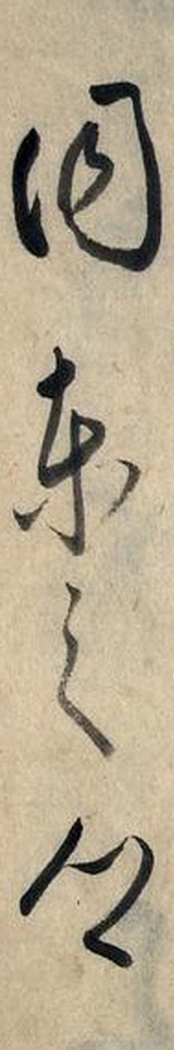同東之郷

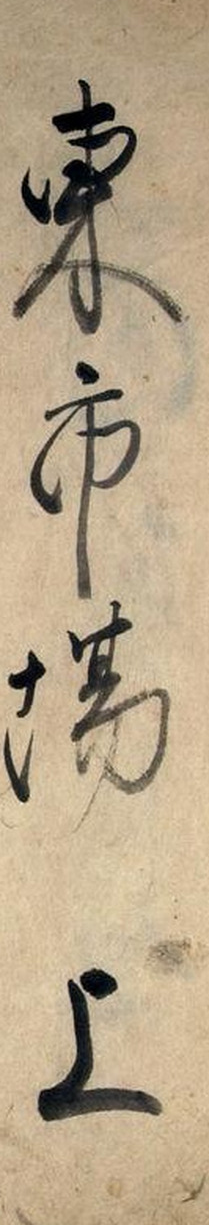東市場上
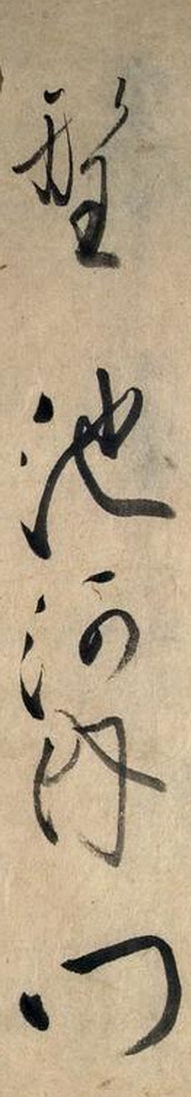野池河内門
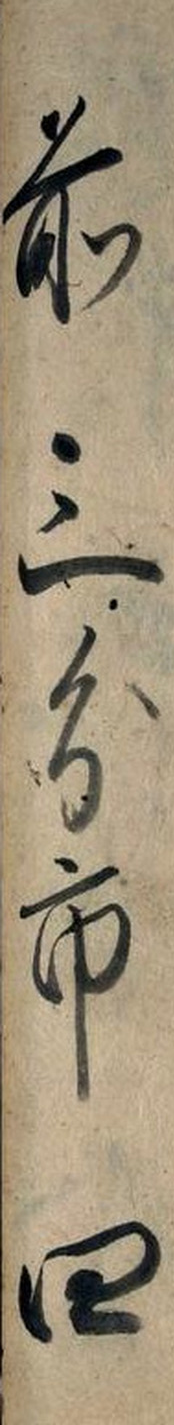前三分市四
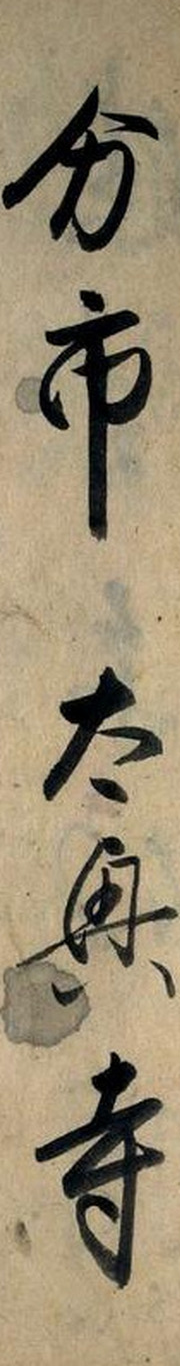分市太興寺
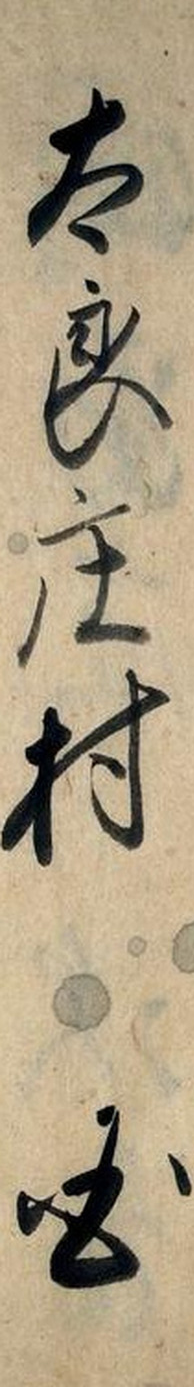太良庄村国
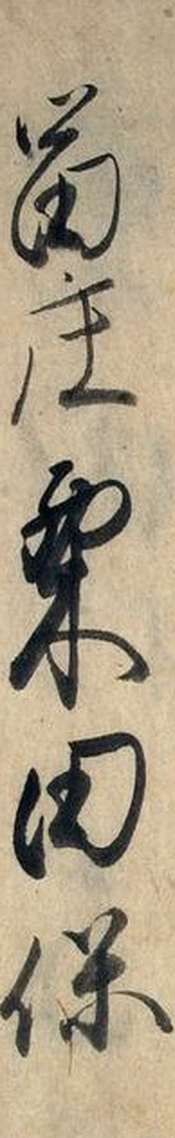富庄粟田保

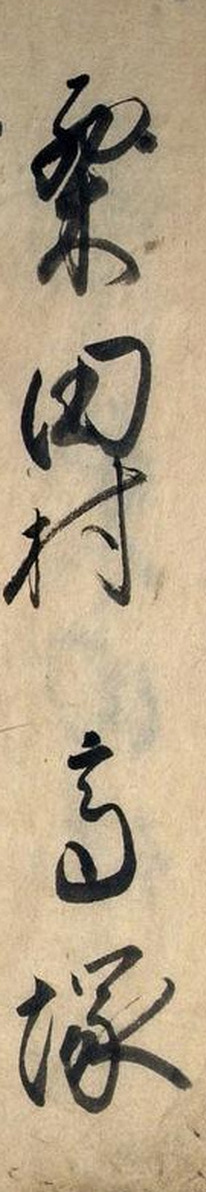粟田村高塚
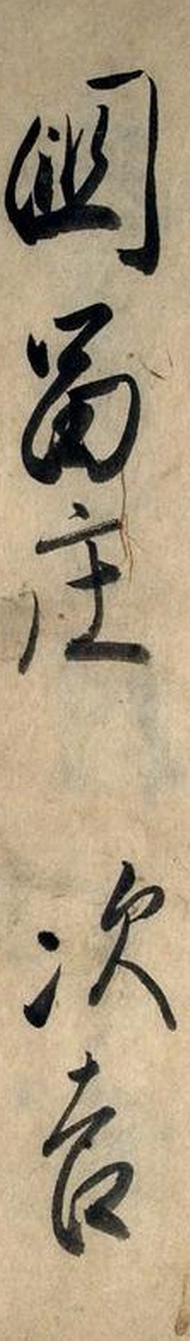国富庄次吉
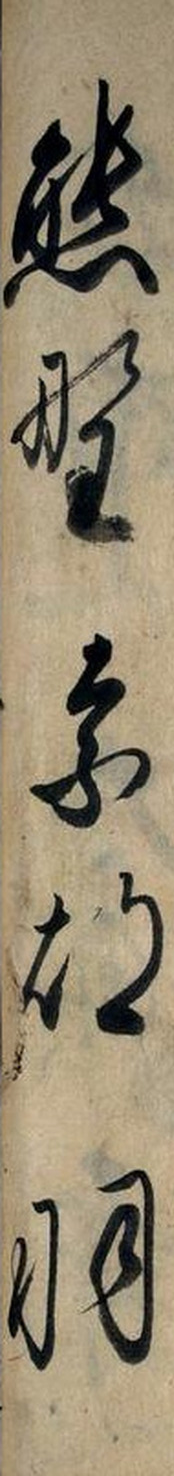熊野奈胡羽
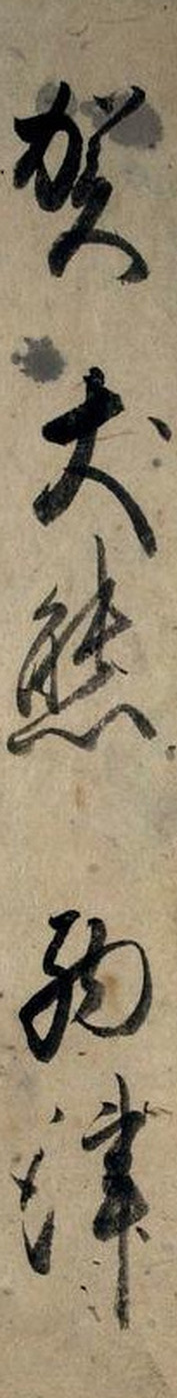賀犬熊西津
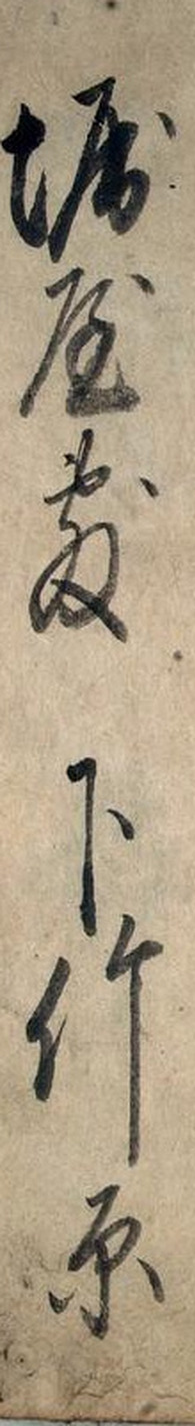堀屋敷下竹原

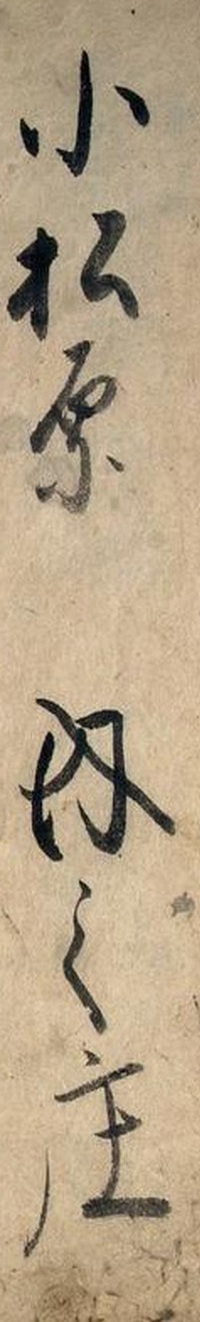小松原内之庄
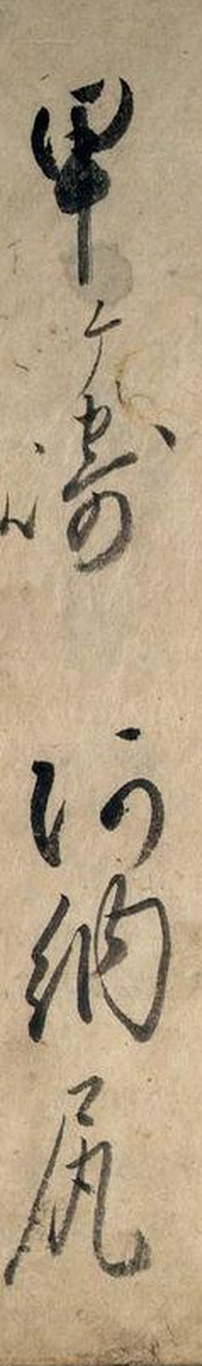甲ヶ崎河納尻
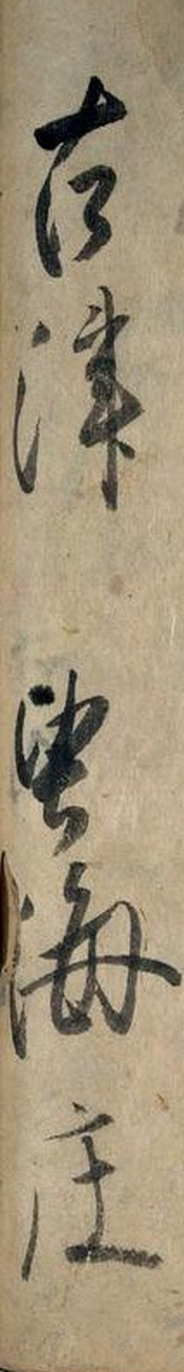古津堅海庄
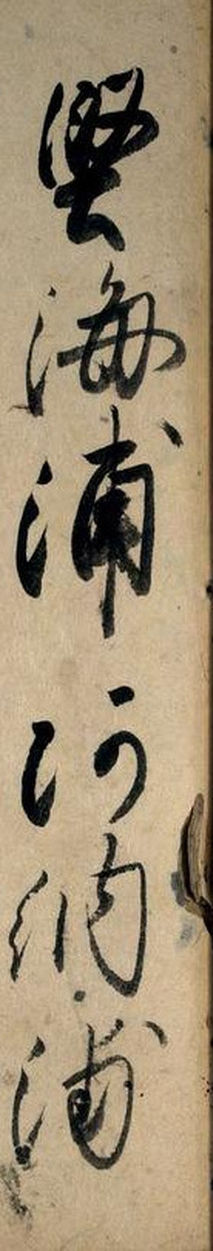堅海浦河納浦
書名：御手本（手習、家号之事、小浜商家の屋号）
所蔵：福井県文書館 Fukui Prefectural Archives
